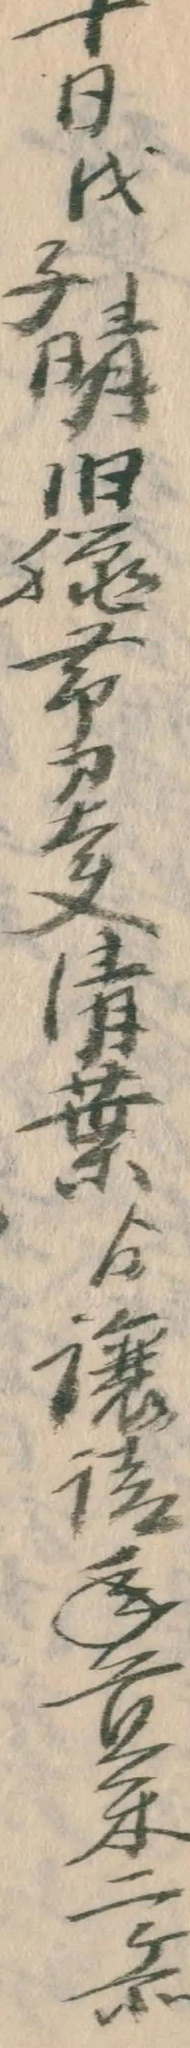十日戊子時旧臘帯刀太夫清葉ゟ譲請年貢米二ケ所
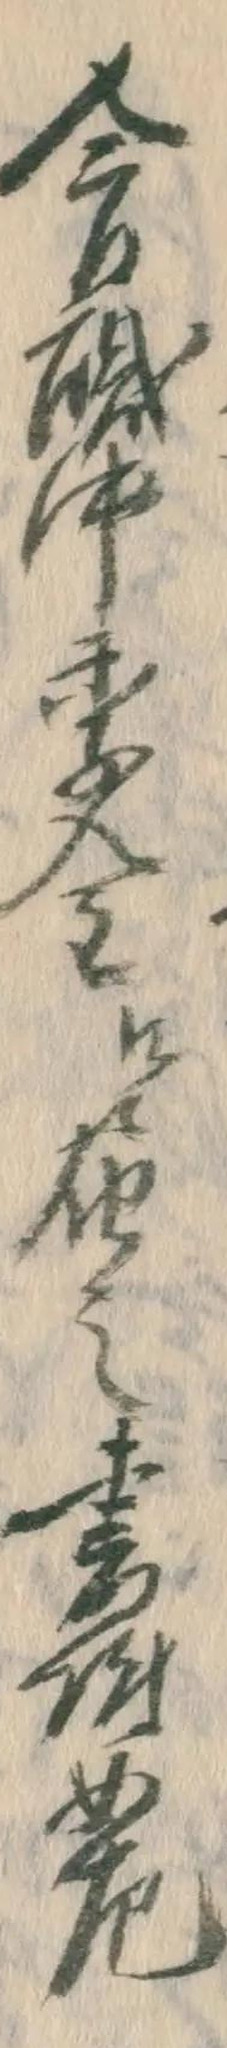今日職中季金え届之書附如左
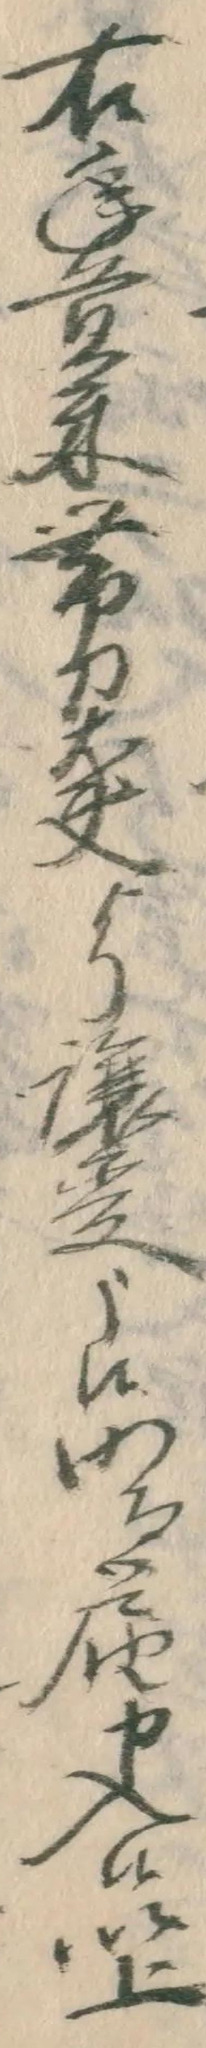右年貢米帯刀大夫より譲受申候仍而御届申入候以上
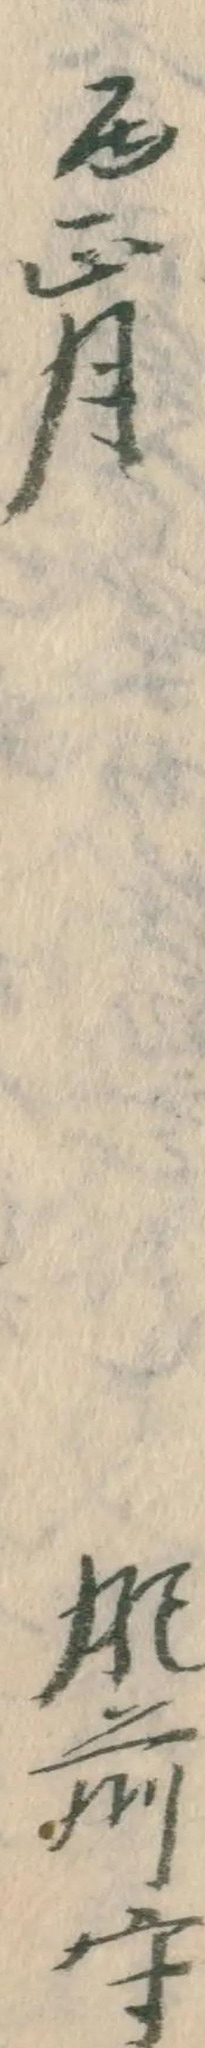酉正月肥前守
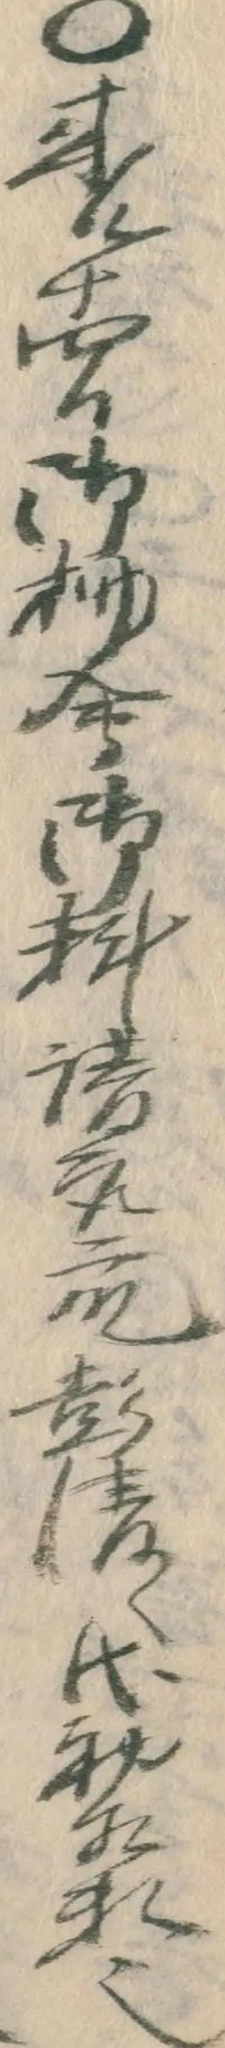○来ル十四日御棚會御料請取衆彭清へ代勤相頼也
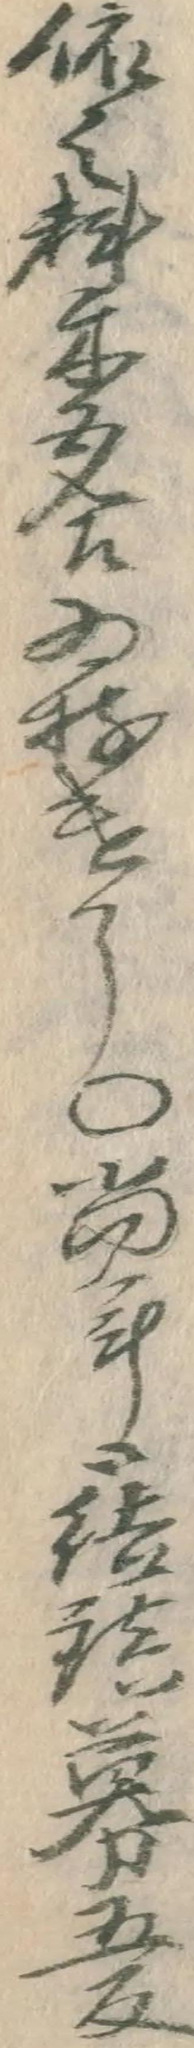依之料米五合為持遣了〇當年御結鎮募五反

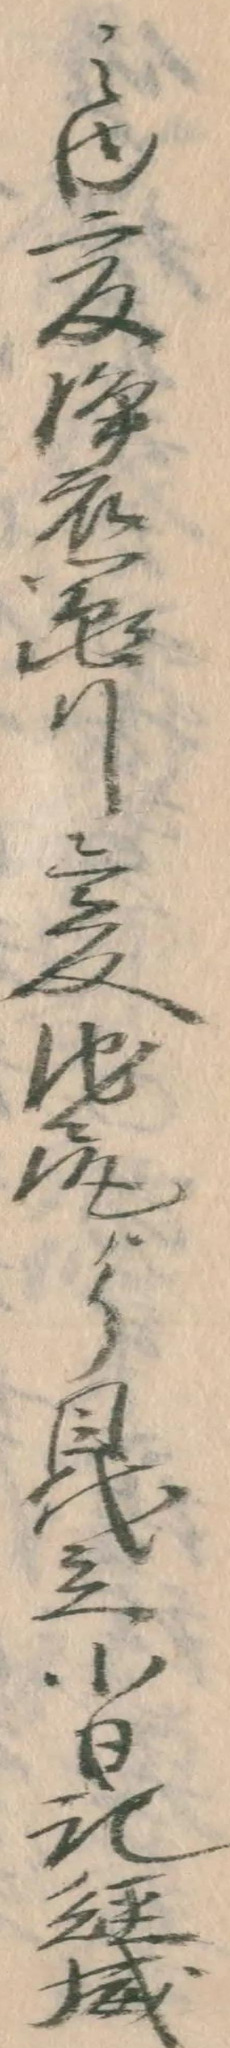之内二反浄衣鬮引壱反池尻より目代立小日記経威
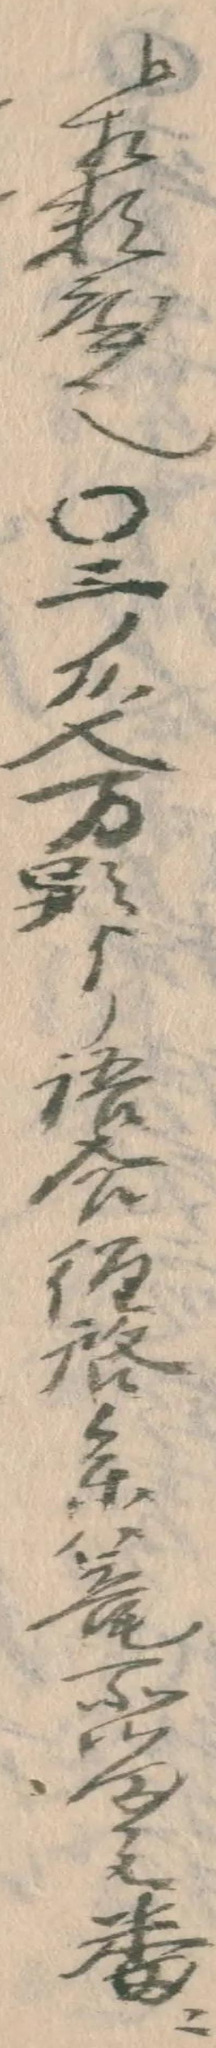え相頼度也○二ノ頭人万顕より詰合経啓参篭所留之番
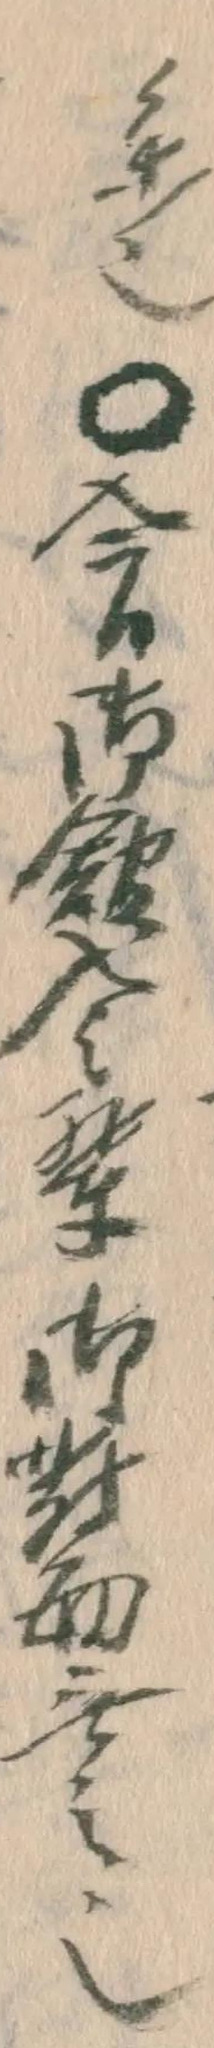参也◯今日御舘入之輩御對面無之也
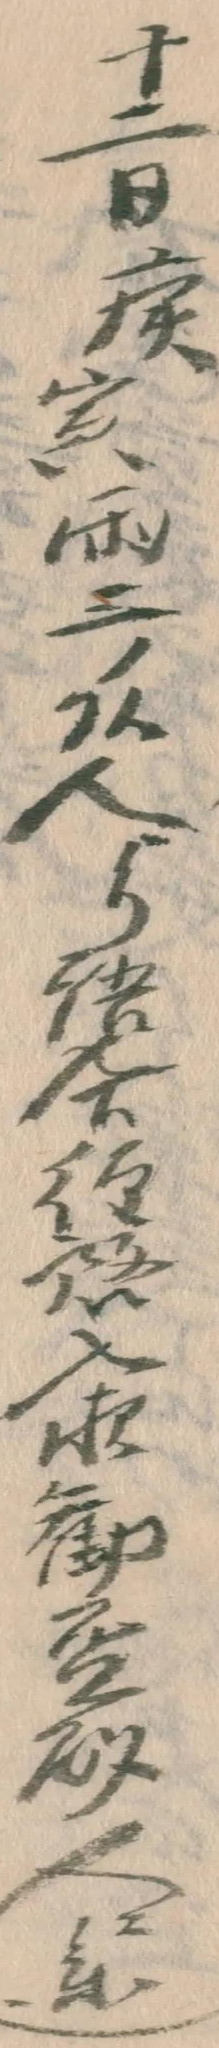十二日庚寅雨三ノ頭人より語合経啓入夜勧盃酌人二参也
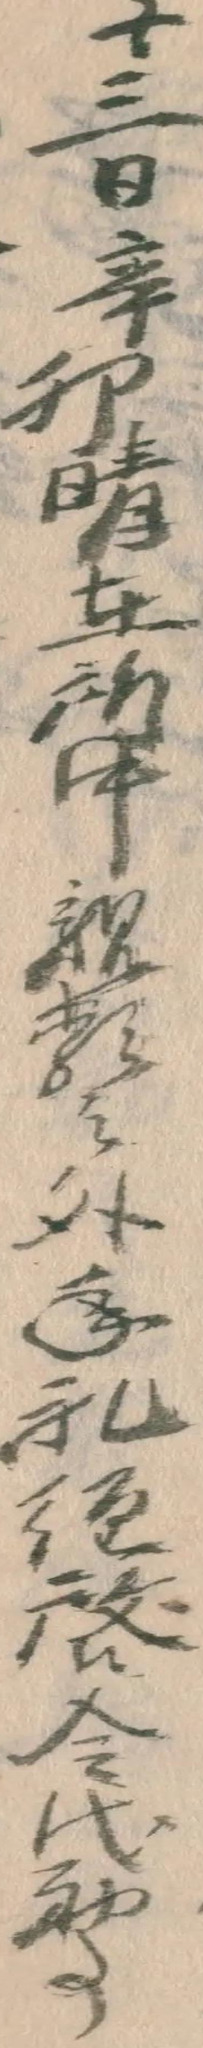十三日辛卯晴在所中親類之外年礼経啓令代勤事
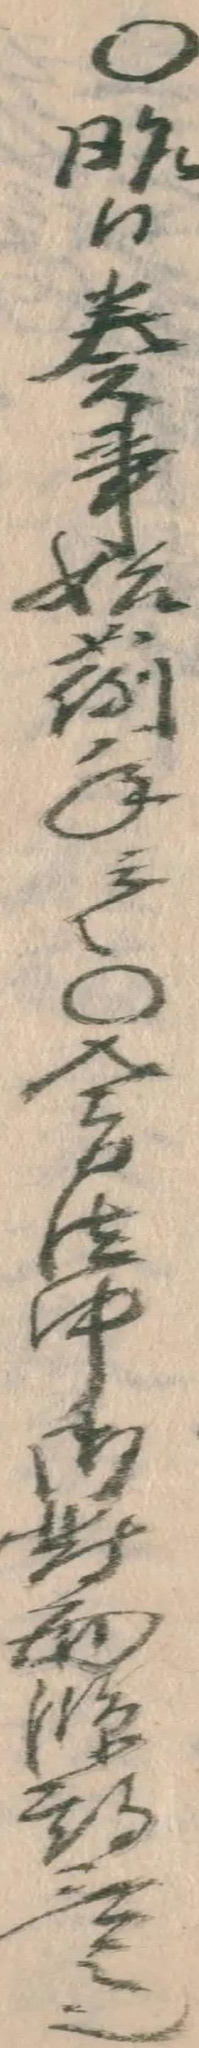〇昨日奏事如例年云〻〇今日法中御對面臨期無之也
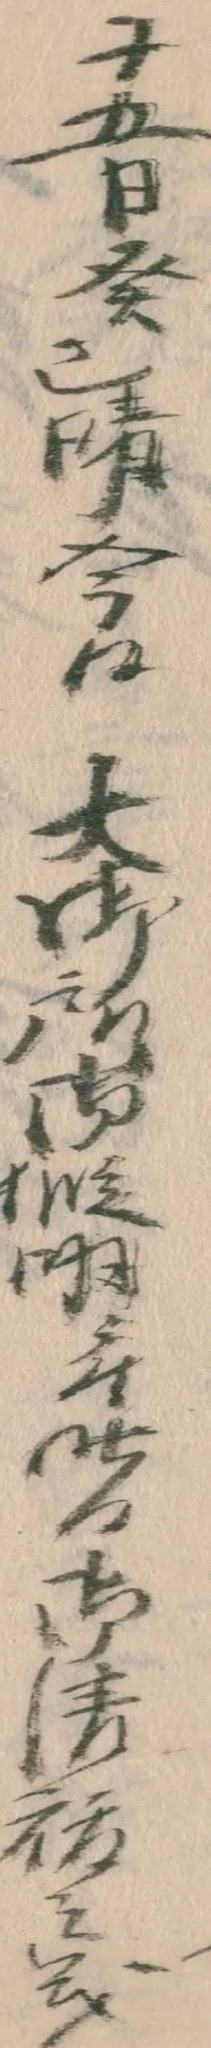十五日癸巳晴今日大御所御假明ニ付昨日御清祓之義
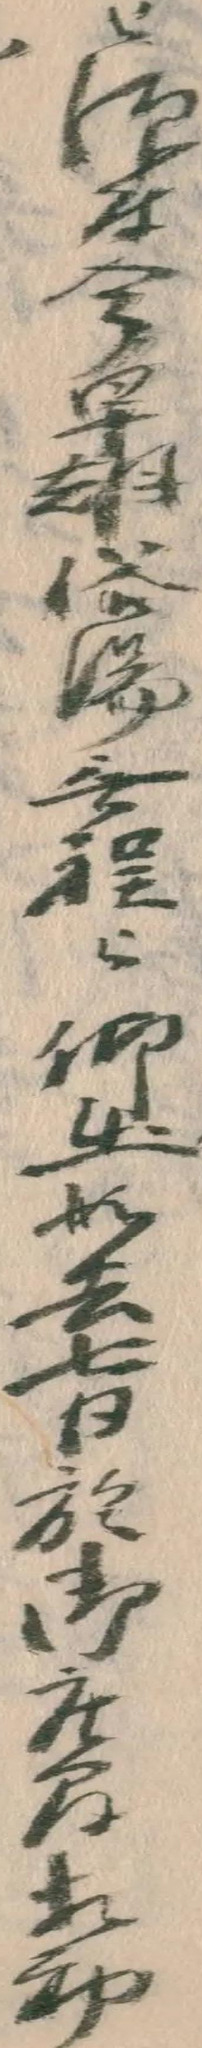被仰付今早朝浴湯無程被仰出如去七日於御座間相勤
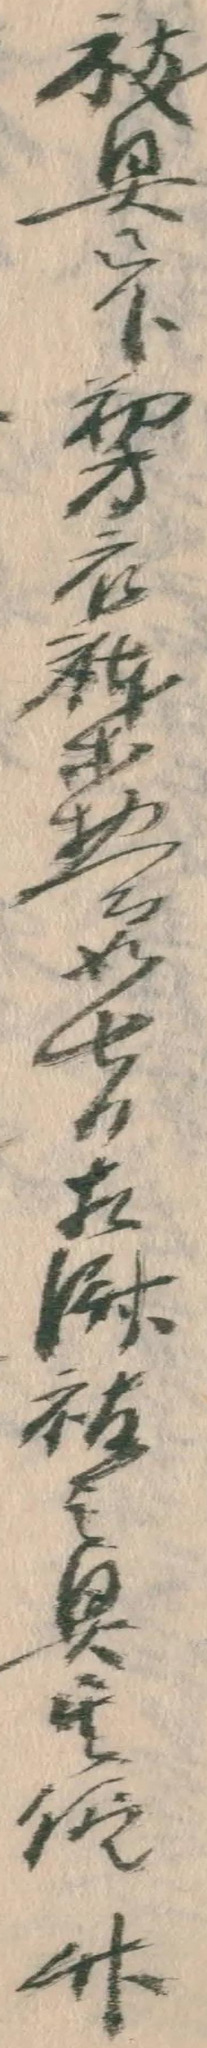祓具已下勤方衣躰等惣而如七日相済祓之具其侭竹
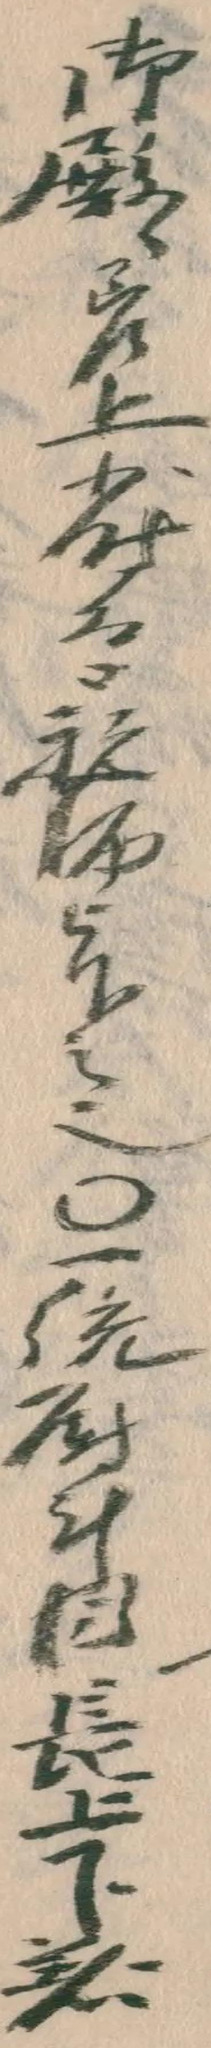御殿へ差上少時而御祝酒被下之也○一統熨斗目長上下着
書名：賀茂社記録. 第67冊
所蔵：国立国会図書館 National Diet Library, JAPAN
